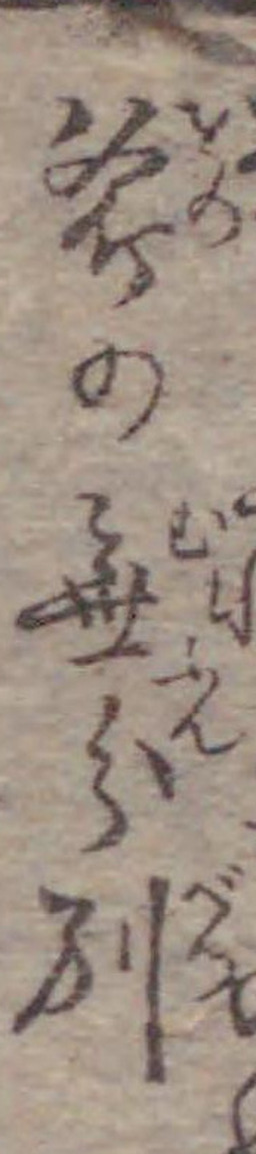斧の無分別
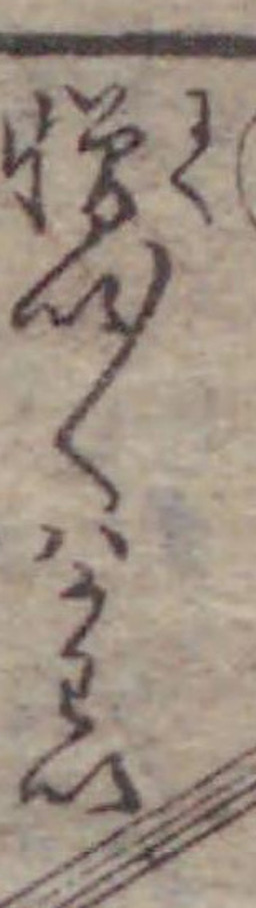憎い〳〵はかわい
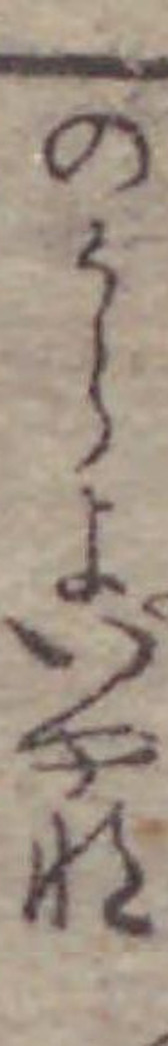のうらよ。いやな
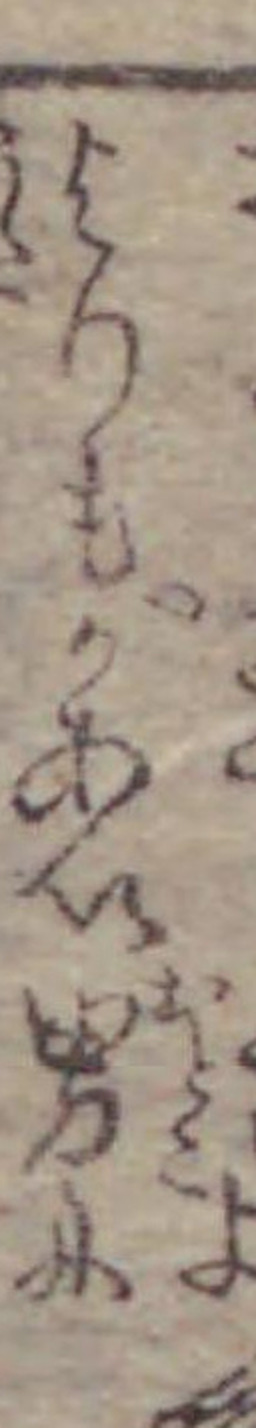よりも。かあい男に
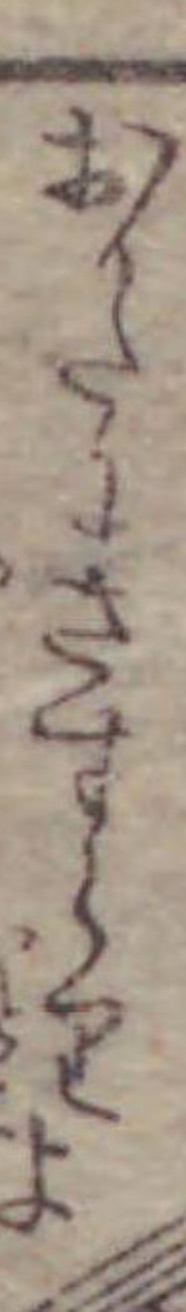おかたにさすらりよ
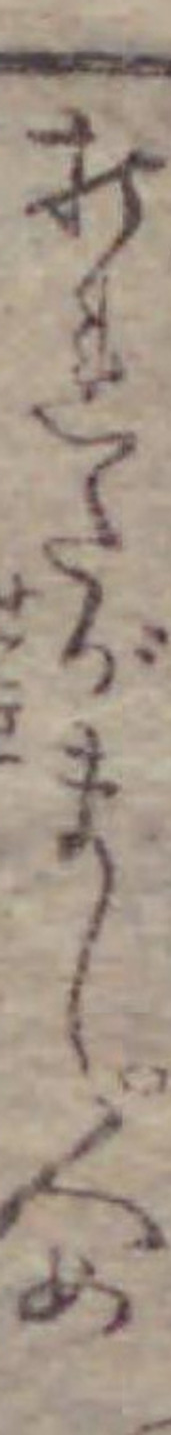打れたがまし。人め
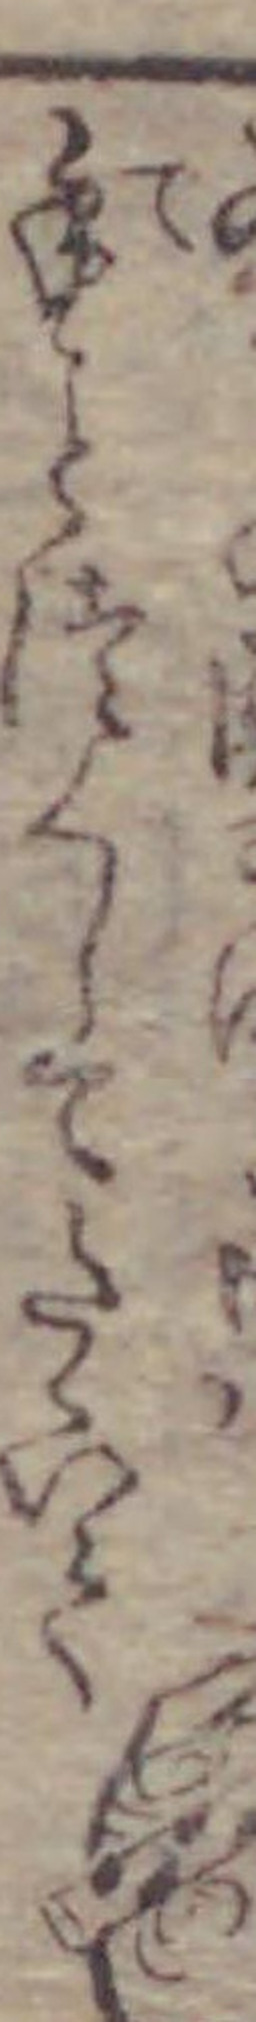手ことつくしてたゝいて
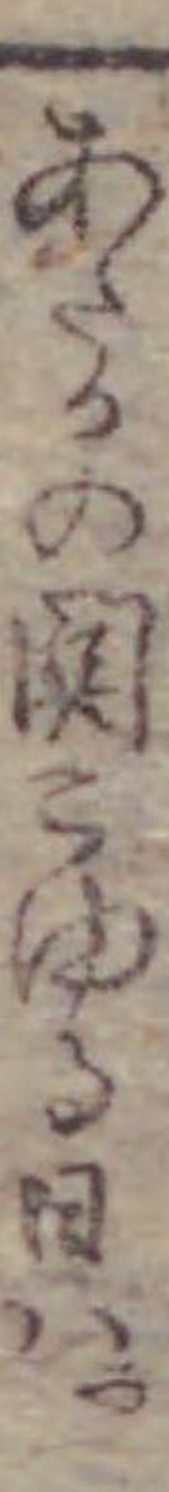あたるの関こゆる日は。
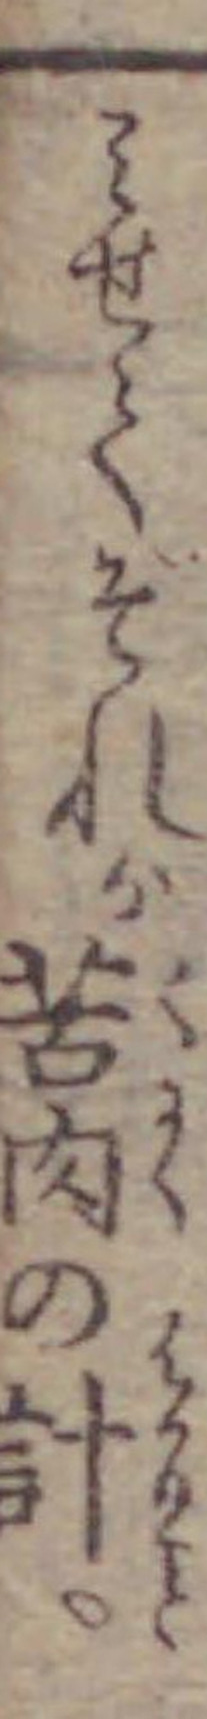みせてそれが苦肉の計。
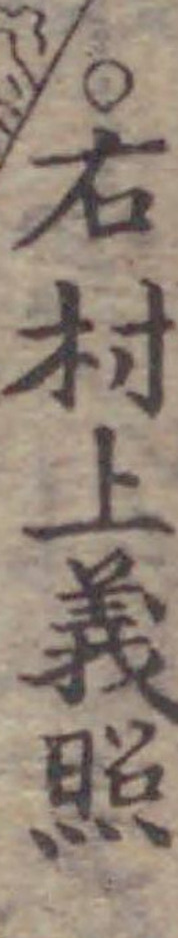○右村上義照
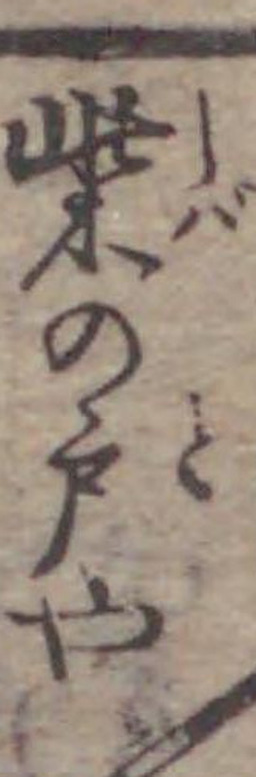柴の戸や
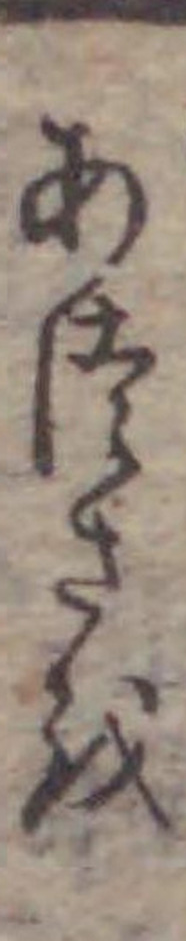あつさを
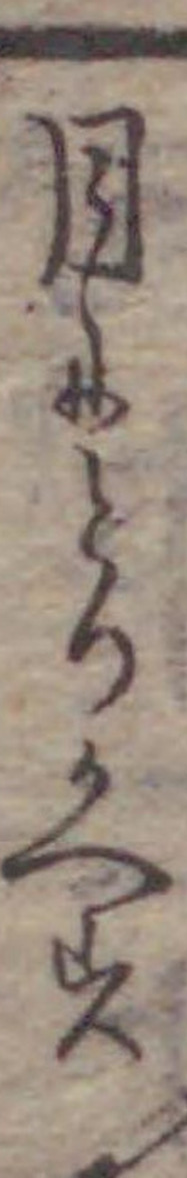月にとりかへす
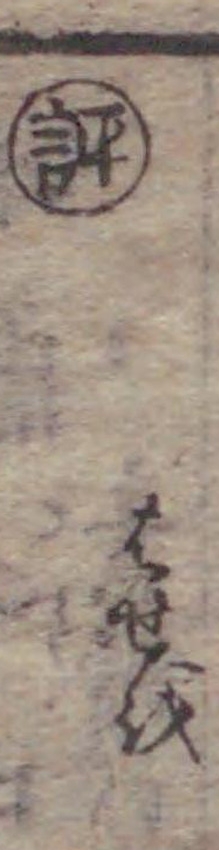はせを
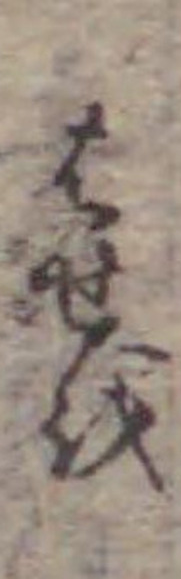はせを
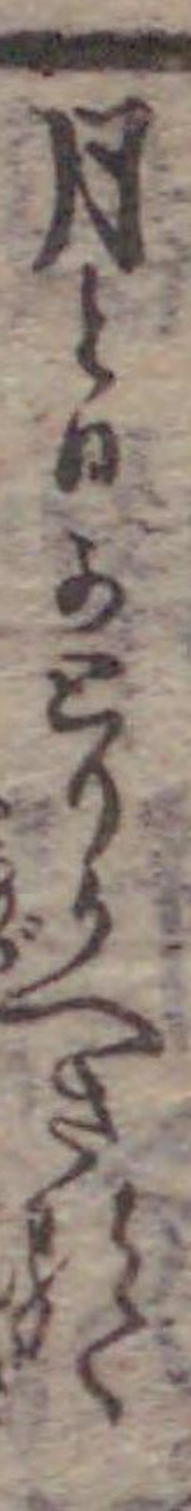月と日かとりかへさるゝ
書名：武者合天狗俳諧 : 2巻
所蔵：国立国会図書館 National Diet Library, JAPAN
